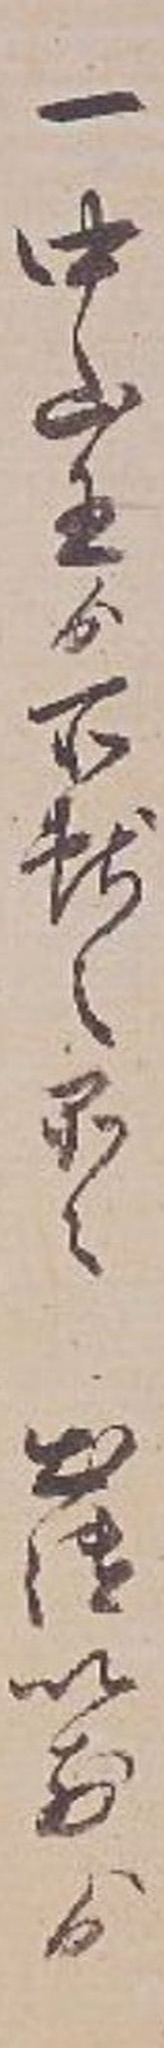一中山王ゟ所献之品々出御以前ゟ
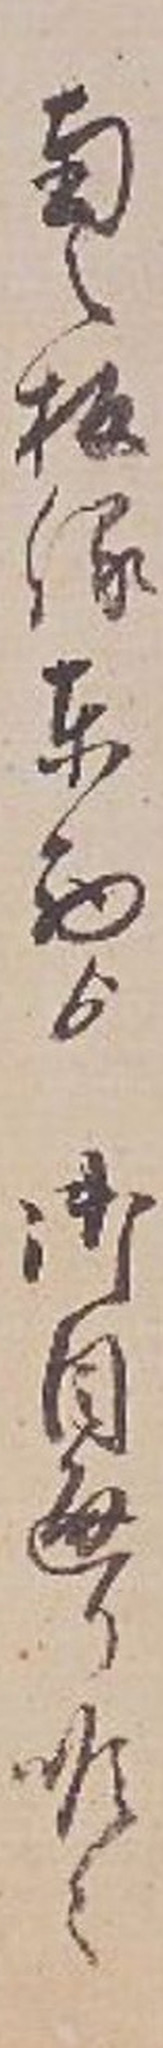南之板縁東西ゟ御目通り順々
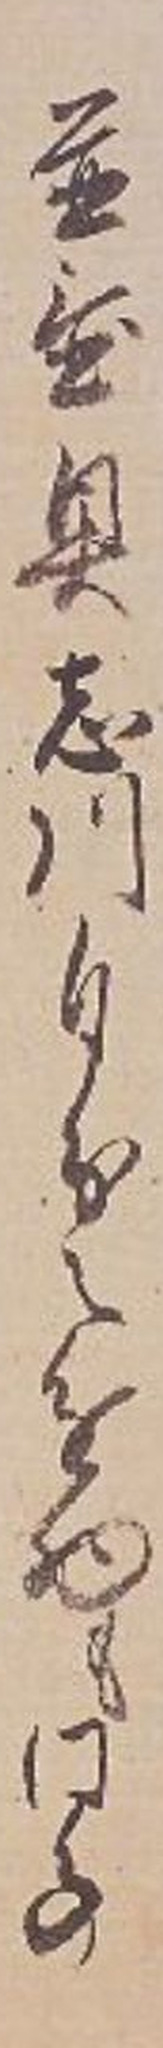並置具志川自分之進物も同事
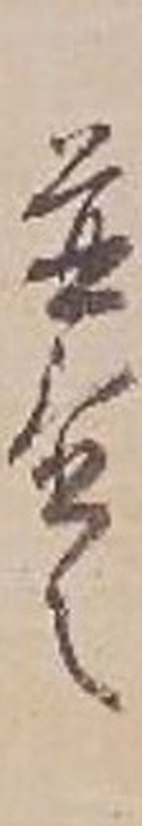並置之
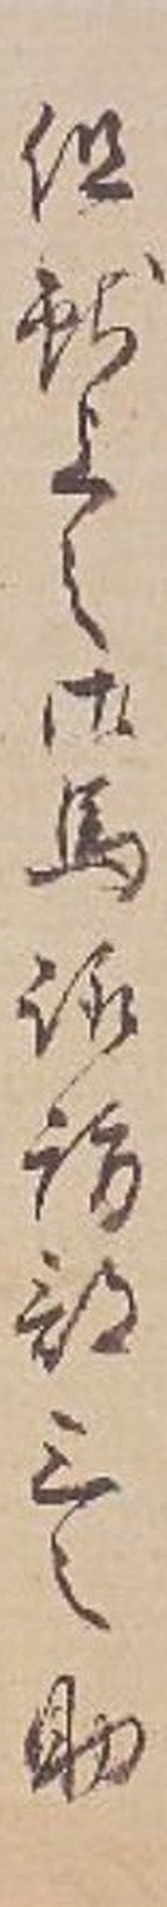但献上之御馬諏訪部三之助
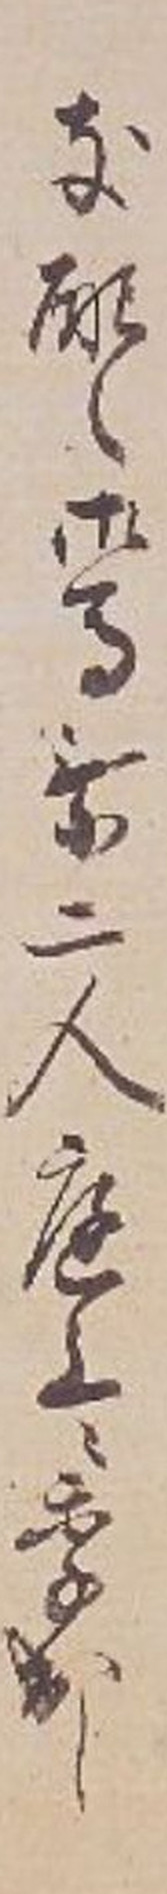支配之御馬乗二人庭上に牽出し
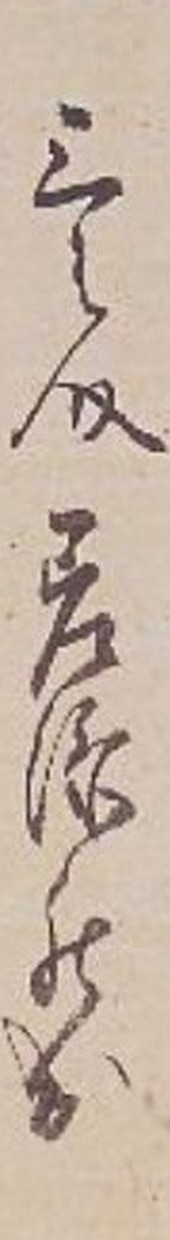三之介差添罷出
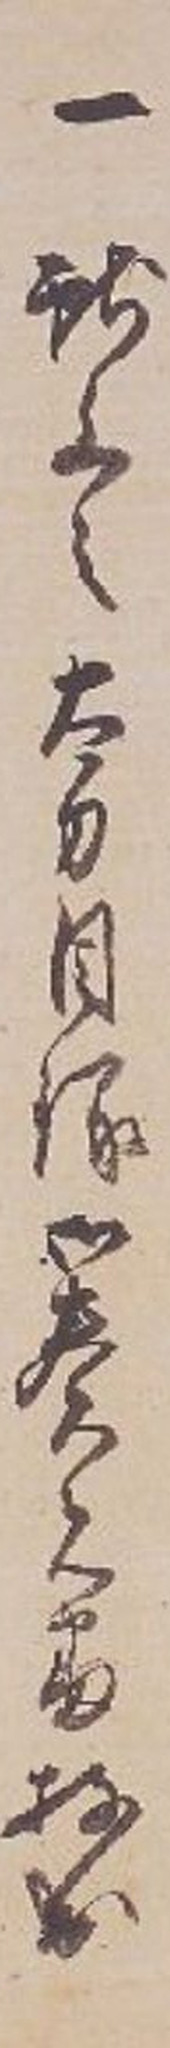一献上之太刀目録御奏者番持出
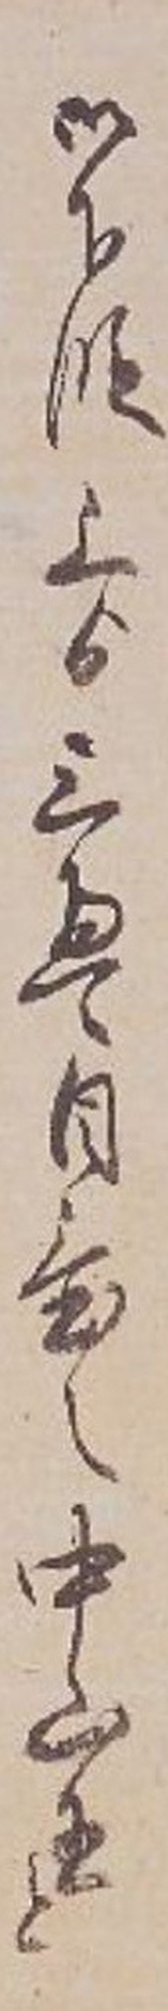御下段上ゟ三畳目置之中山王を
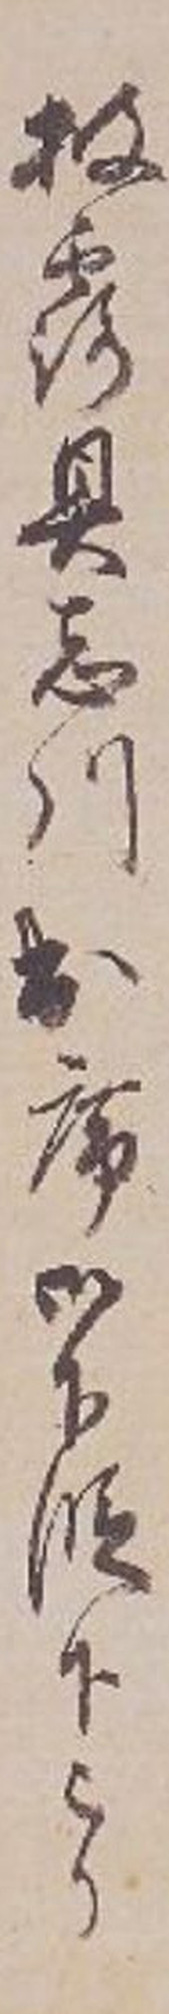披露具志川出席御下段下より
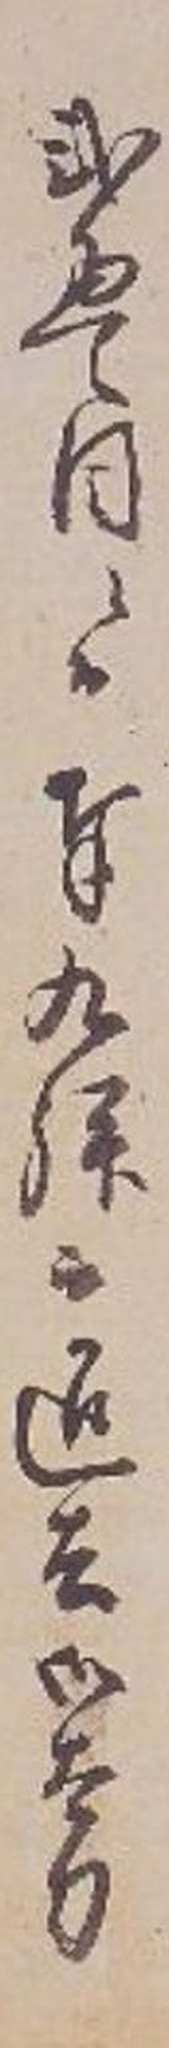弐畳目に而奉九拝而退去御太刀

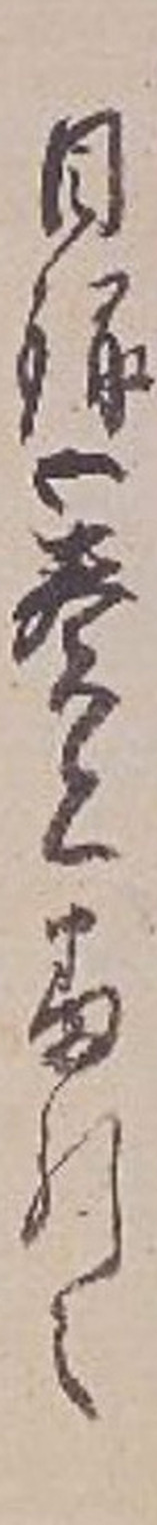目録御奏者番引之
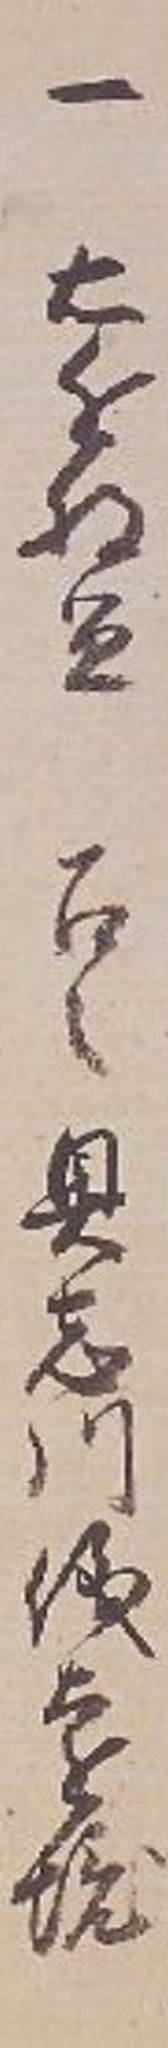一右近将監召之具志川儀遠境
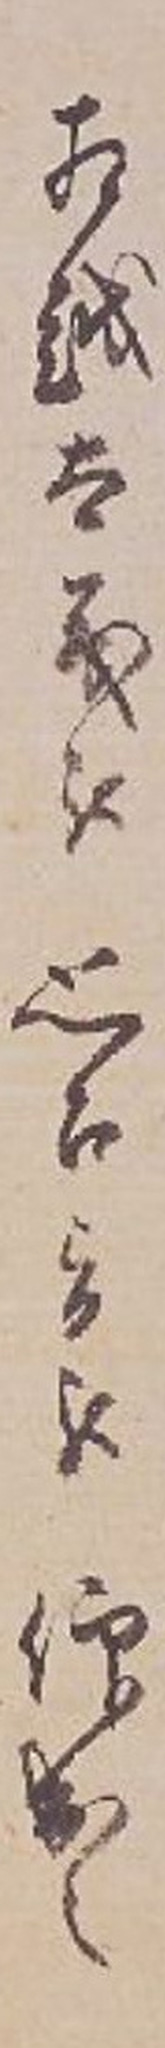相越太義被思召旨被仰出之
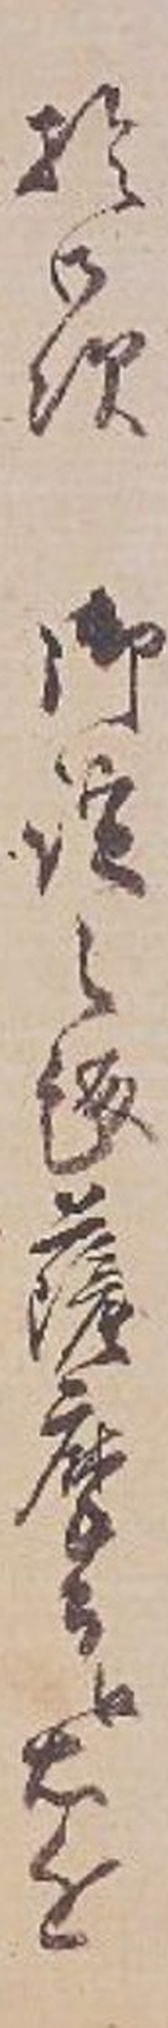於御次御諚之趣薩摩守え右近
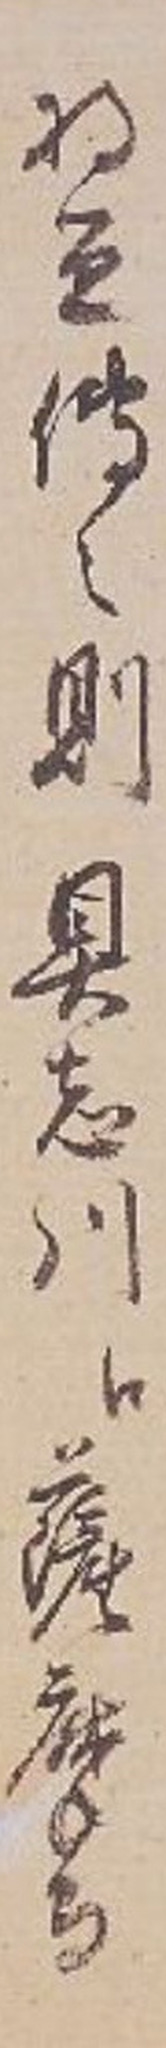将監伝之則具志川え薩摩守
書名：琉球人来朝記 五、六、七
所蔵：University of the Ryukyus Library
